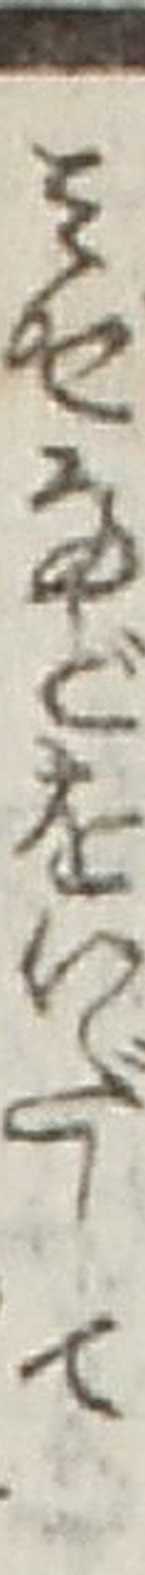みせなどをいだして
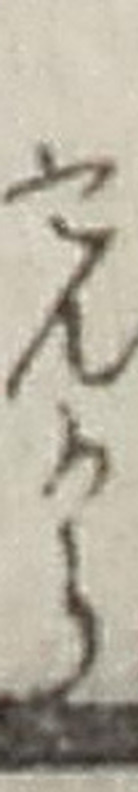せんから
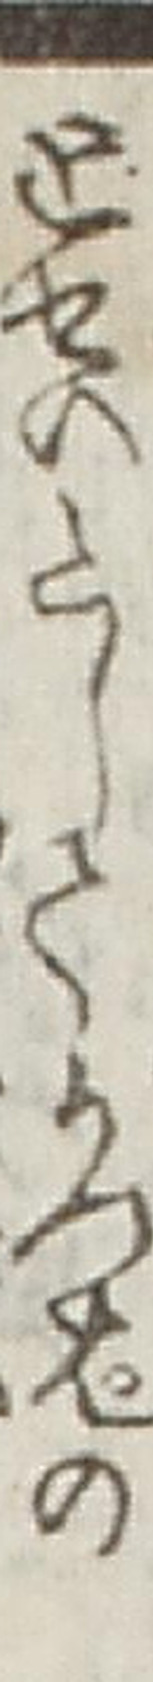とせいゝたしてかつぱの
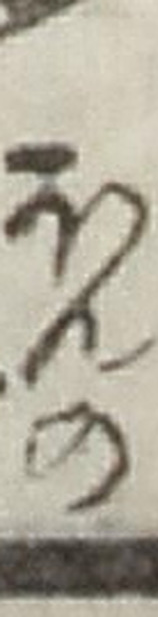ほんの
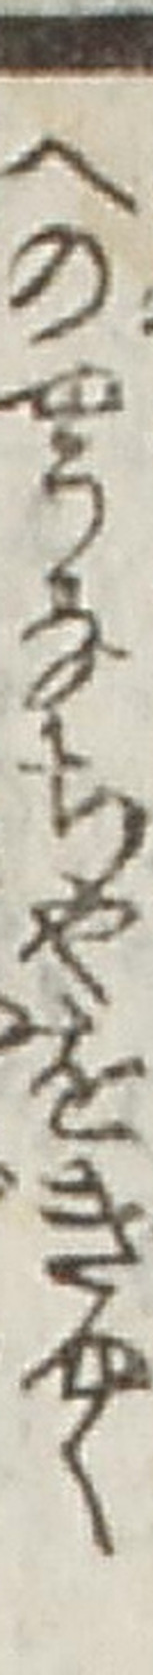へのやうなちやをきやく
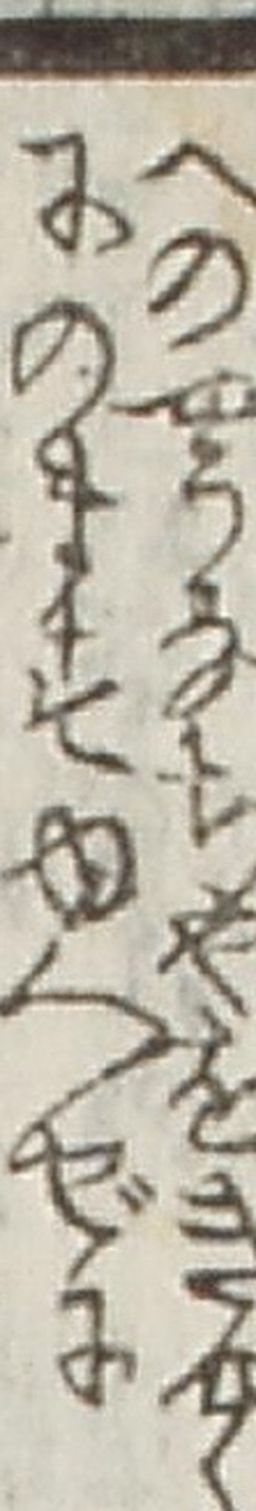にのますゆへぜに
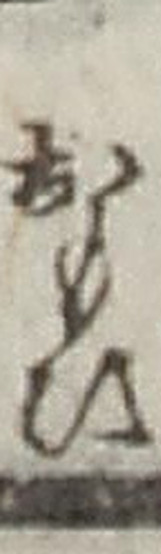おもひ
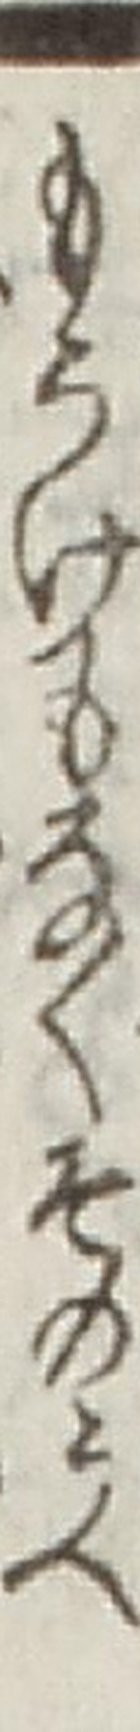もうけもなくそのうへ
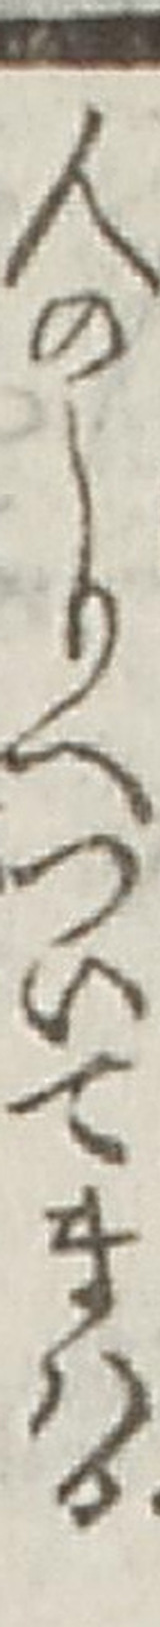人のしりへついてまはる
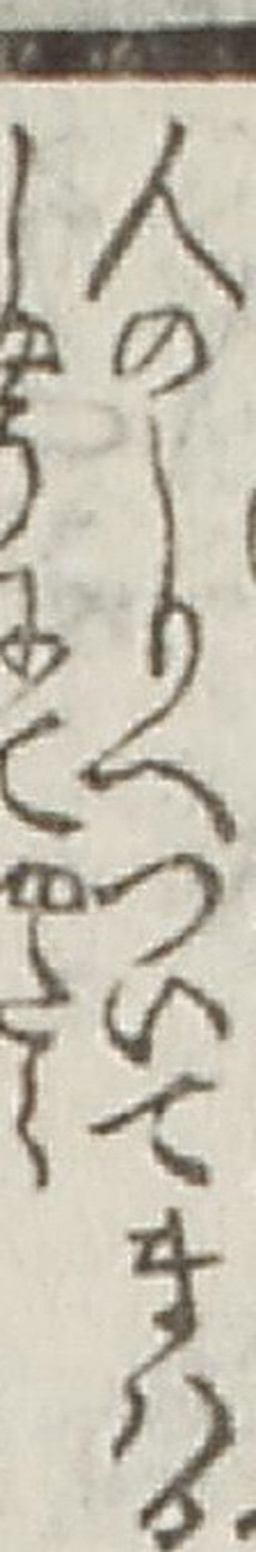しやうにてやたら
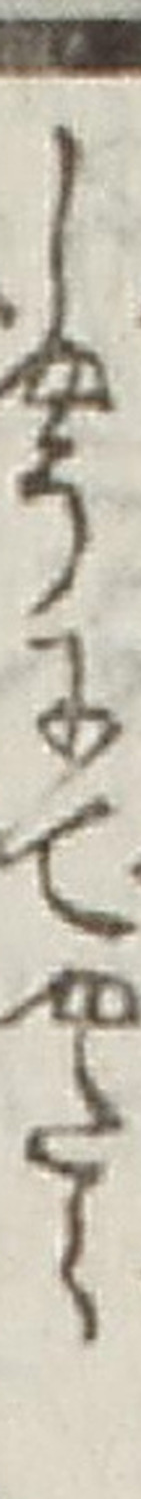しやうにてやたら
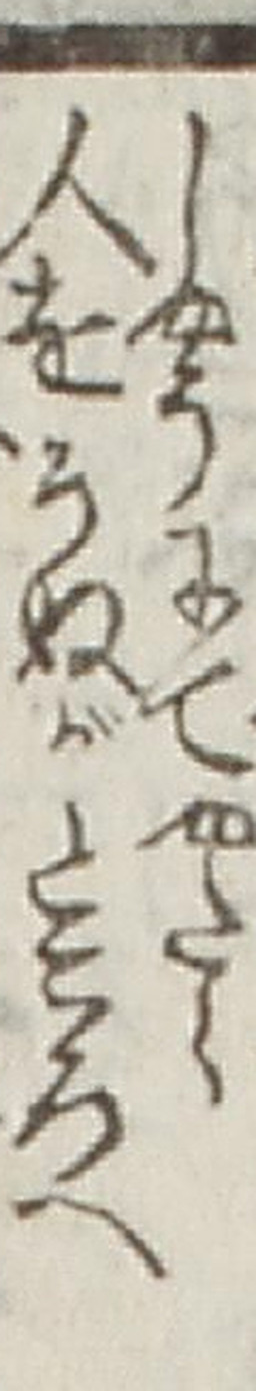人をうぬがところへ
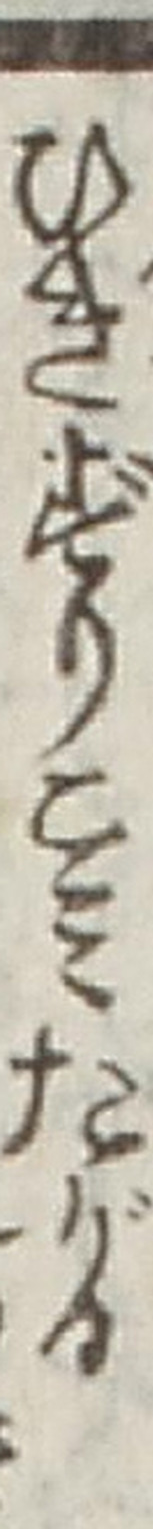ひきずりこみたがる
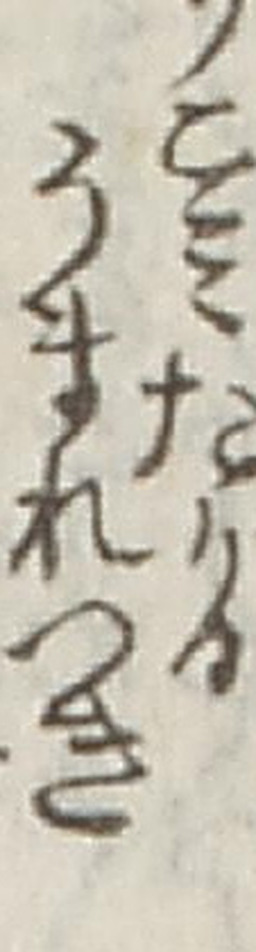うまれつき
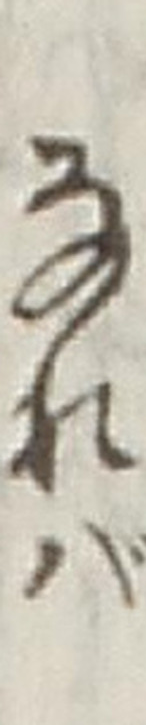なれば
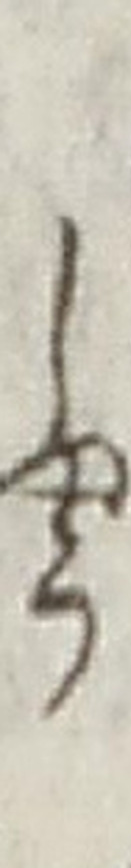しやう
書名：三世相出雲當座帳　上下冊
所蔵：東京大学地震研究所図書室 Earthquake Research Institute Library, The University of Tokyo, JAPAN
